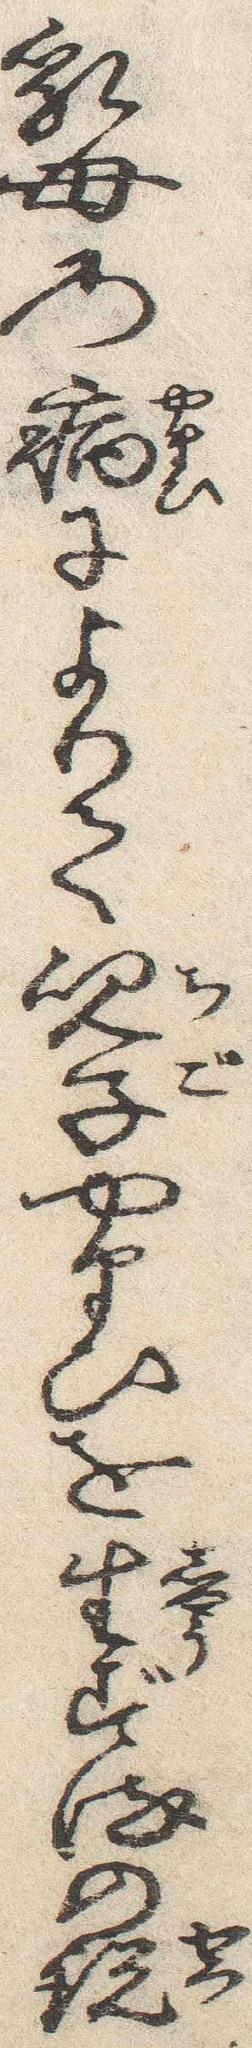㊉乳母の病によりて児子やまひを生ずるの説
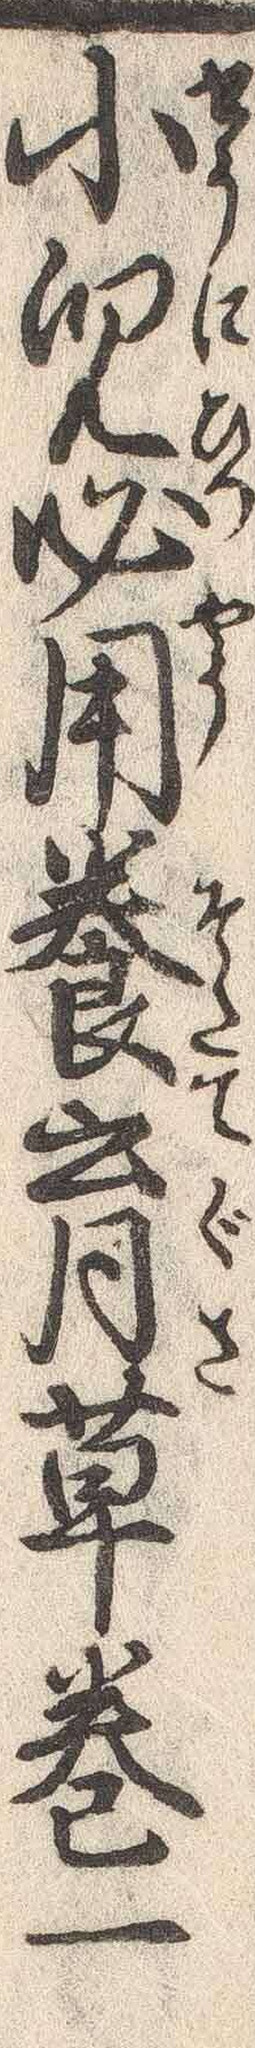小児必用養育草巻一
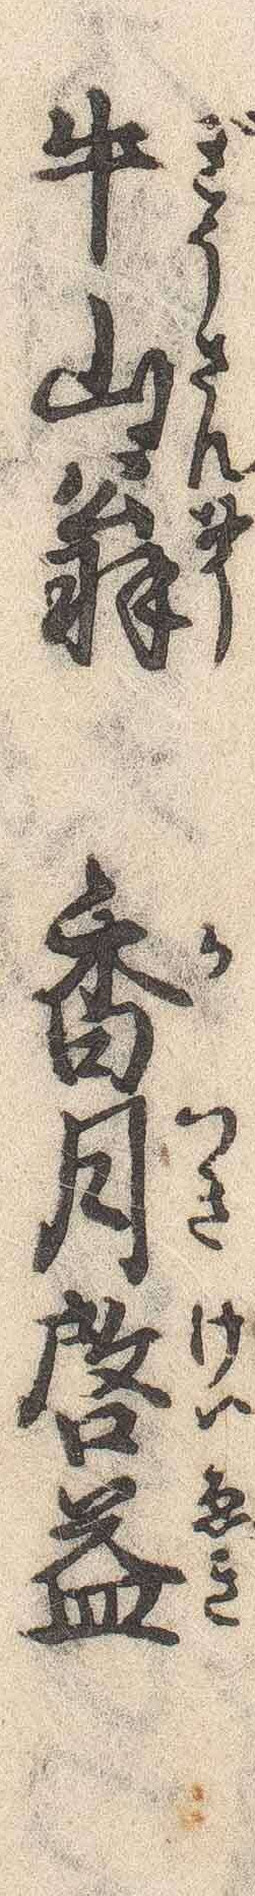牛山翁香月啓益纂
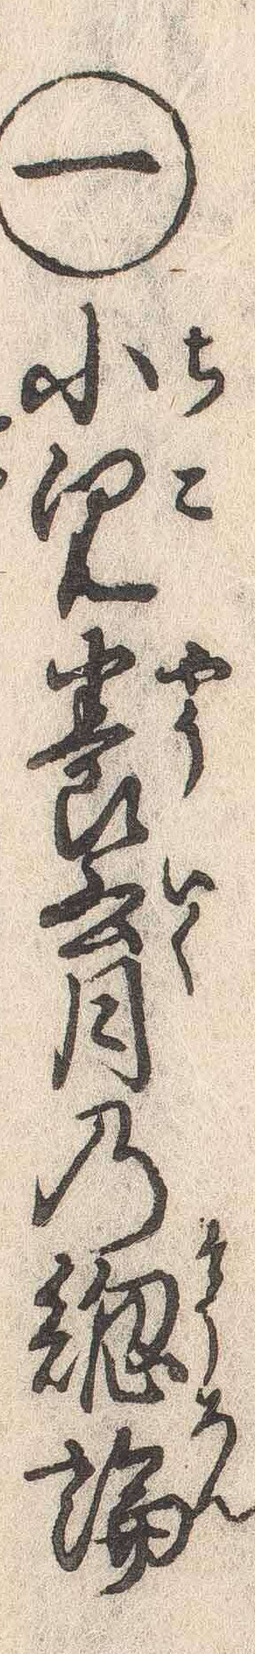㊀小兒養育の緫論
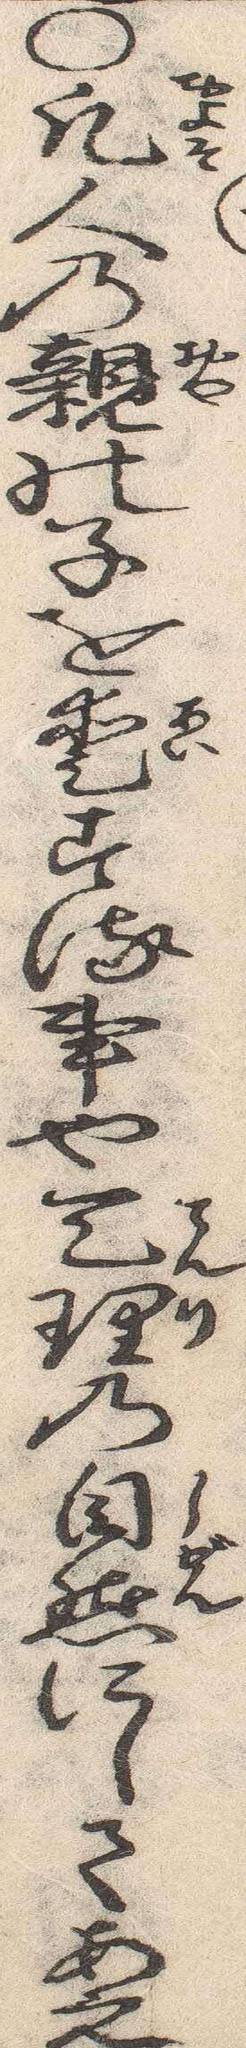◯凢人の親の子を愛する事や天理の自然にしてあえ
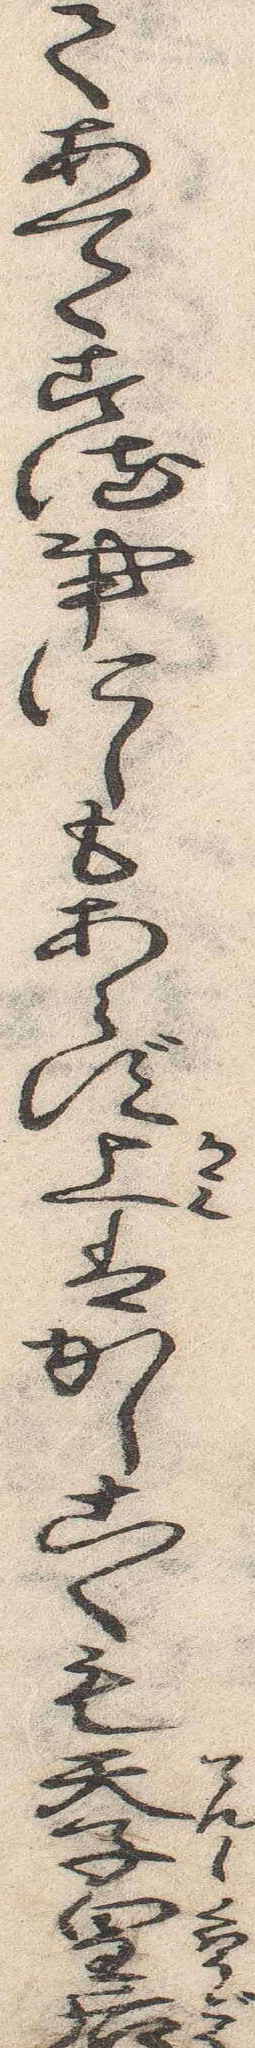てあてゝする事にしもあらず上はかしこくも天子皇后
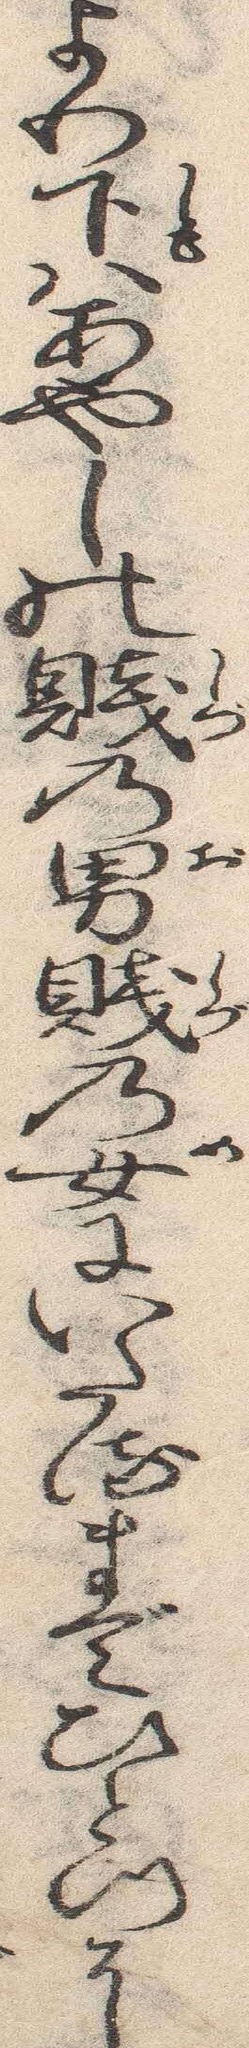より下はあやしの賤の男賤の女にいたるまでひとつに
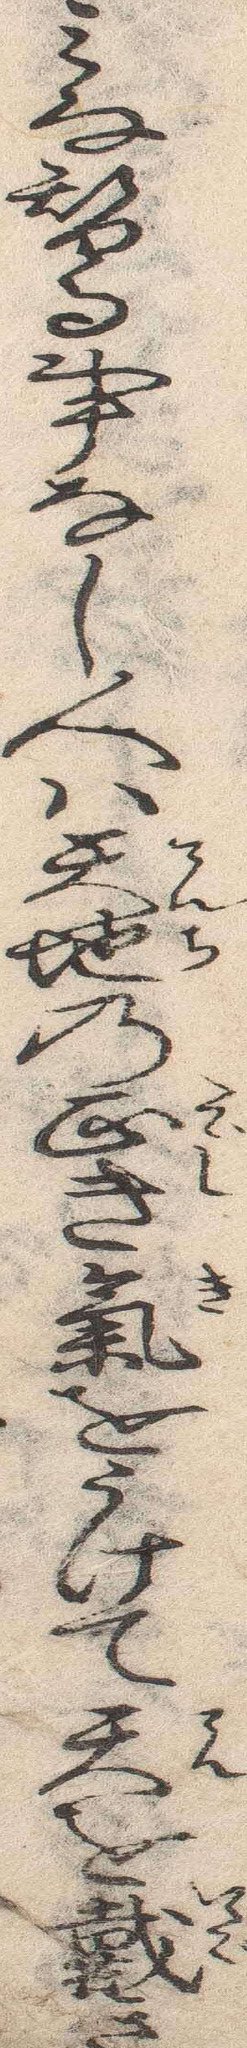みな替る事なし人は天地の正き氣をうけて天を戴き
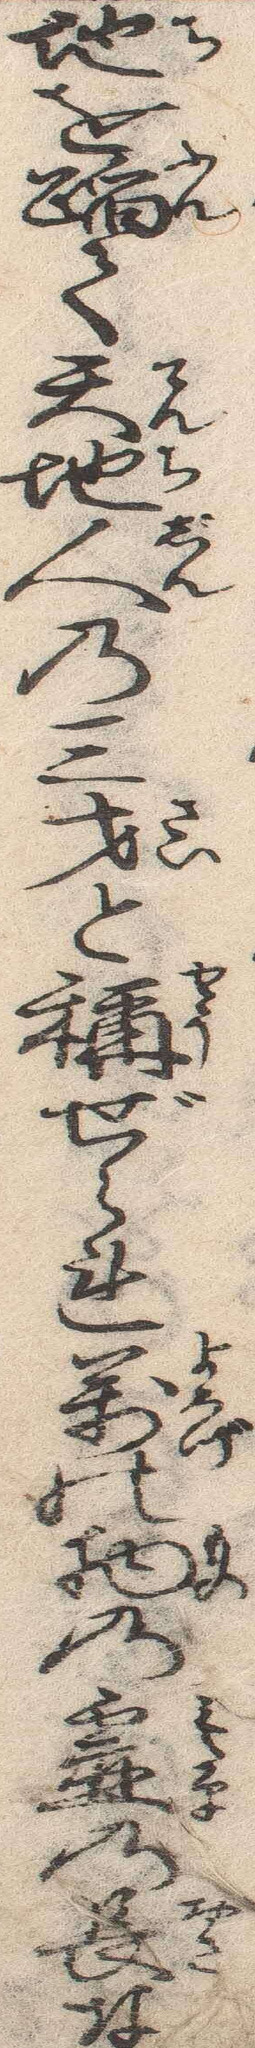地を𨂻て天地人の三才と稱ぜられ萬の物の霊の長な
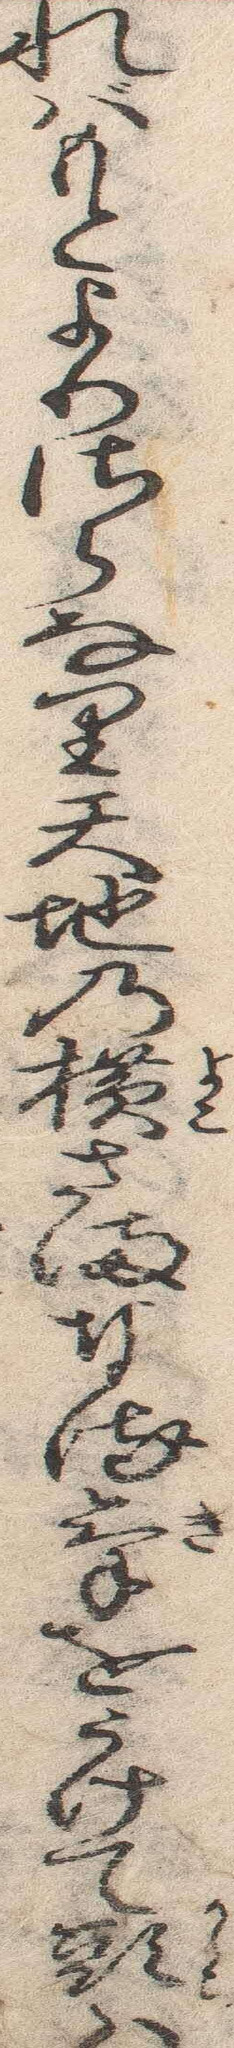ればもとよりつらなり天地の横さまなる氣をうけて頭は
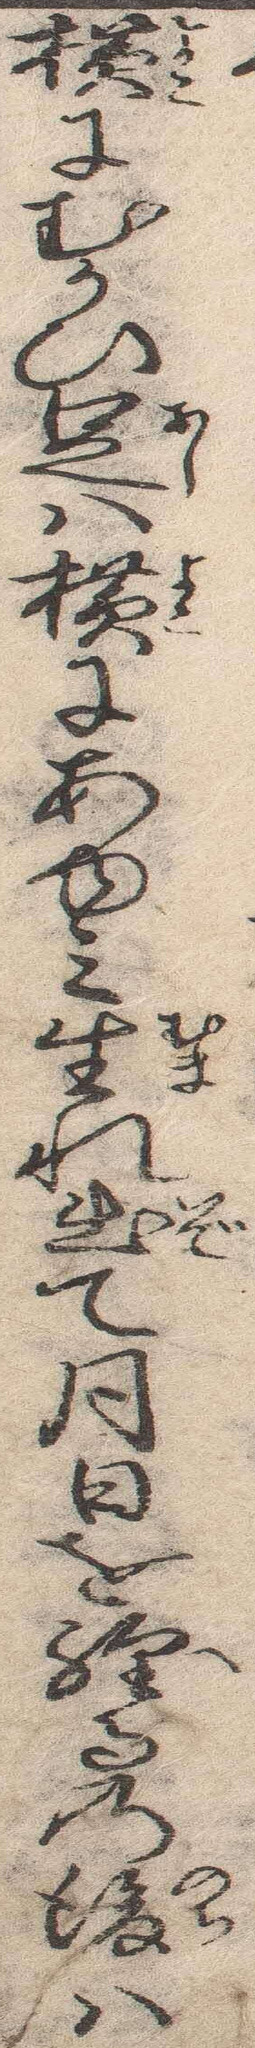横にむかひ足は横にあゆみ生れ出て月日を經るの後は

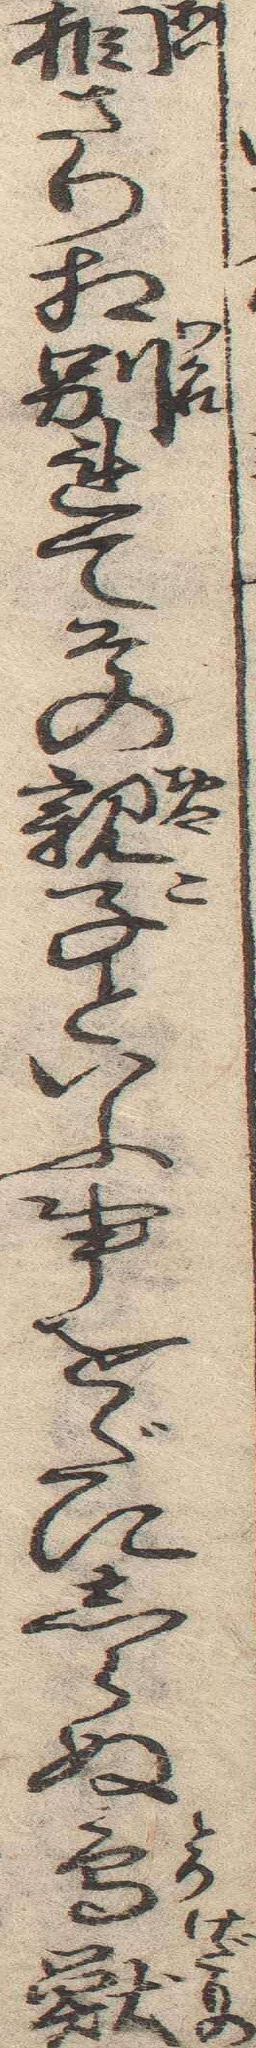相さり相別れてその親子といふ事をだにしらぬ鳥獣
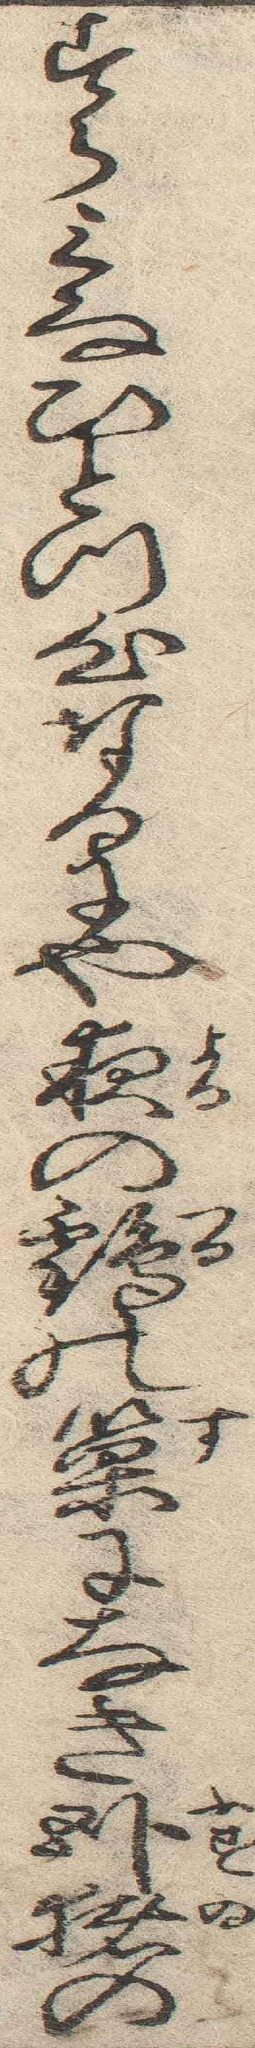すらみなひとつ心なるにや夜の鶴の巣になき臥猪の
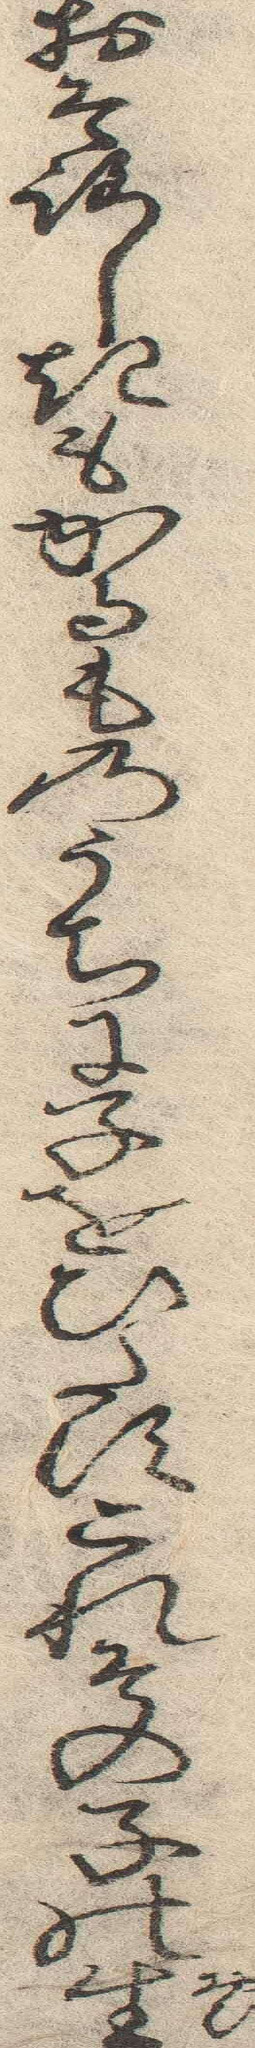おそろしきもかるものうちに子をひたすこれその子の生
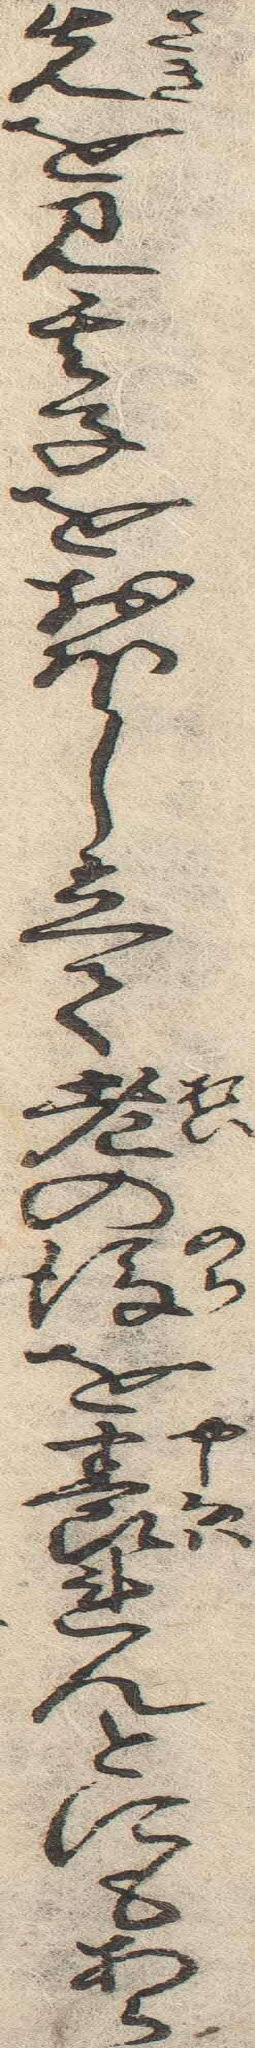先を見其子をおほし立て老の後を養れんとにもあら
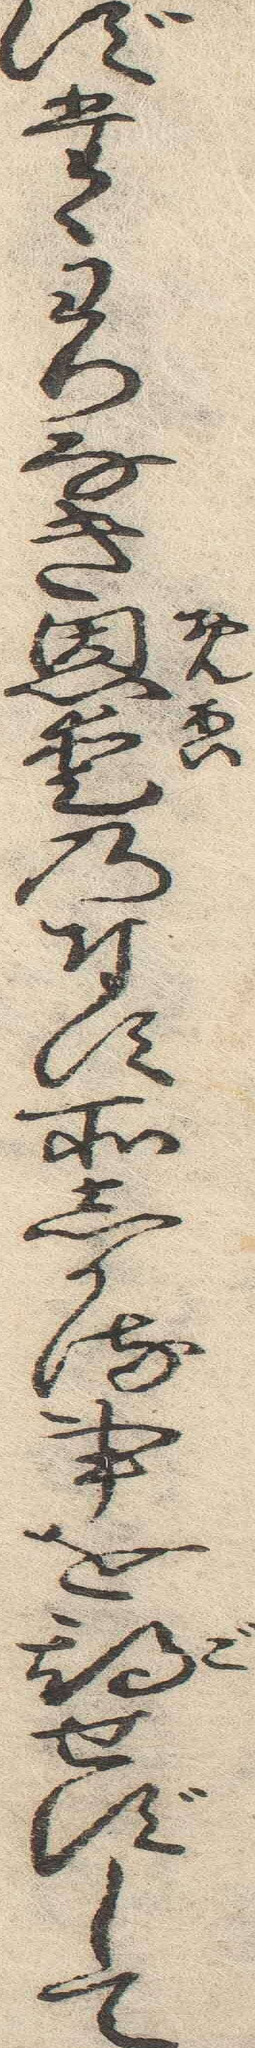ずたゝわりなき恩愛のなす所しかる事を期せずして
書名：小児必用養育草
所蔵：東京学芸大学附属図書館 国文学研究資料館
